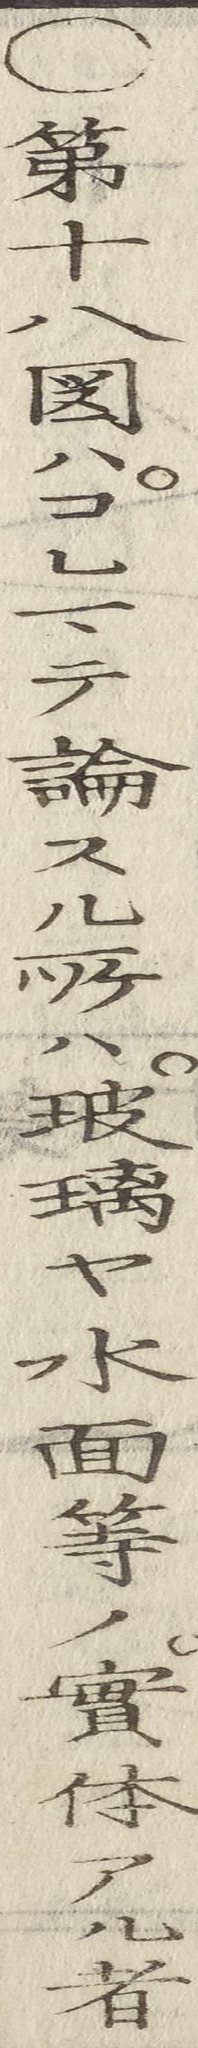○第十八図ハ。コレマテ論スル所ハ。玻璃ヤ水面等ノ。実体アル者
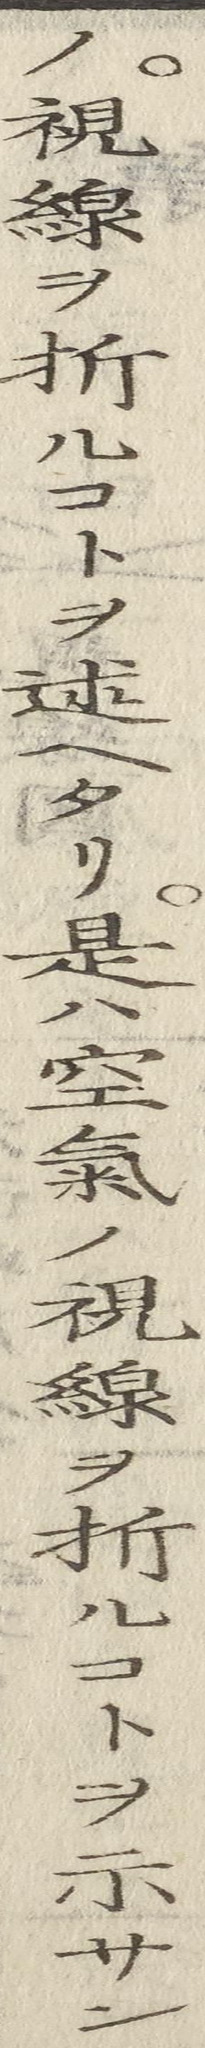ノ。視線ヲ折ルコトヲ述ヘタリ。是ハ空気ノ視線ヲ折ルコトヲ示サン
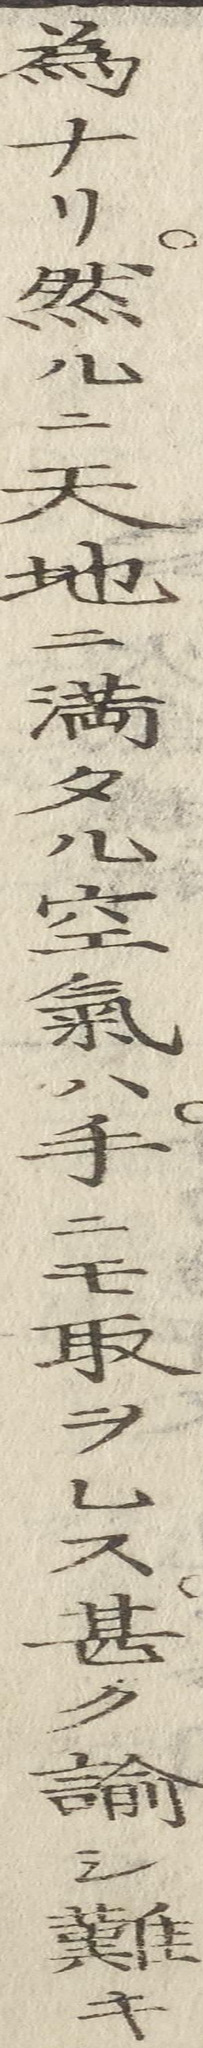為ナリ。然ルニ天地ニ満タル空気ハ。手ニモ取ヲレス。甚ク論シ難キ

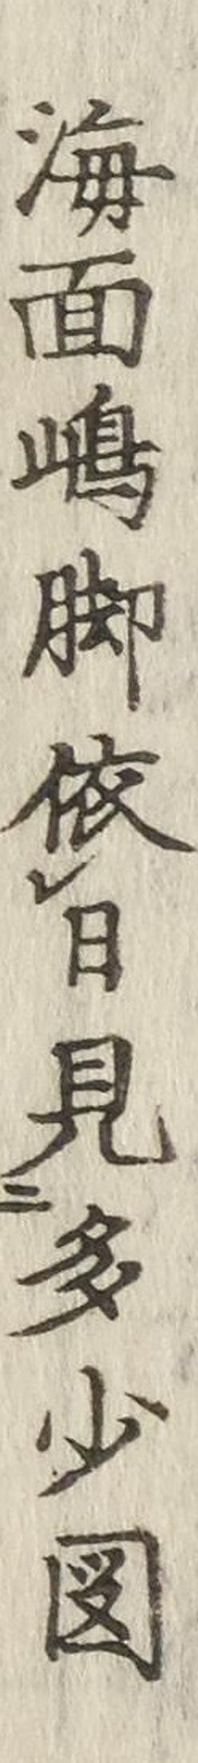海面嶋脚依日見多少図
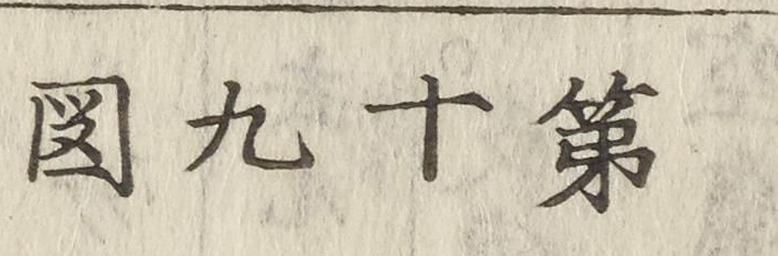第十九図
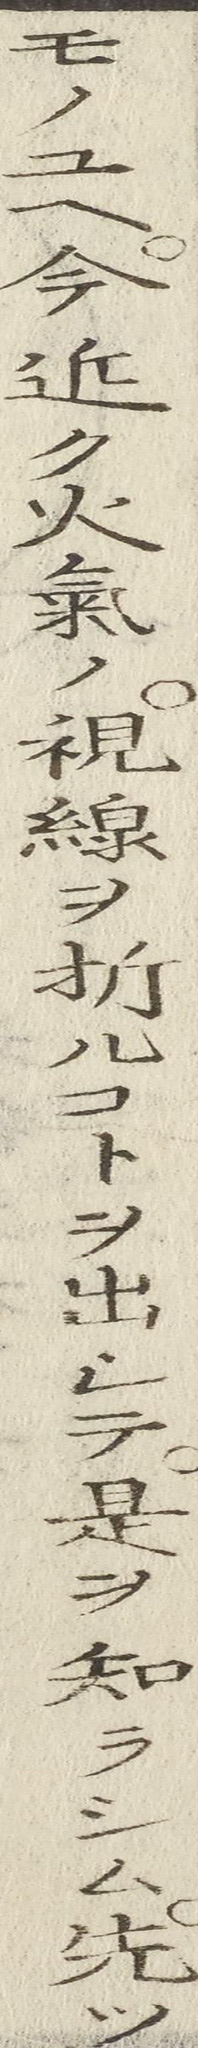モノユヘ。今近ク火気ノ。視線ヲ折ルコトヲ出シテ。是ヲ知ラシム。先ツ
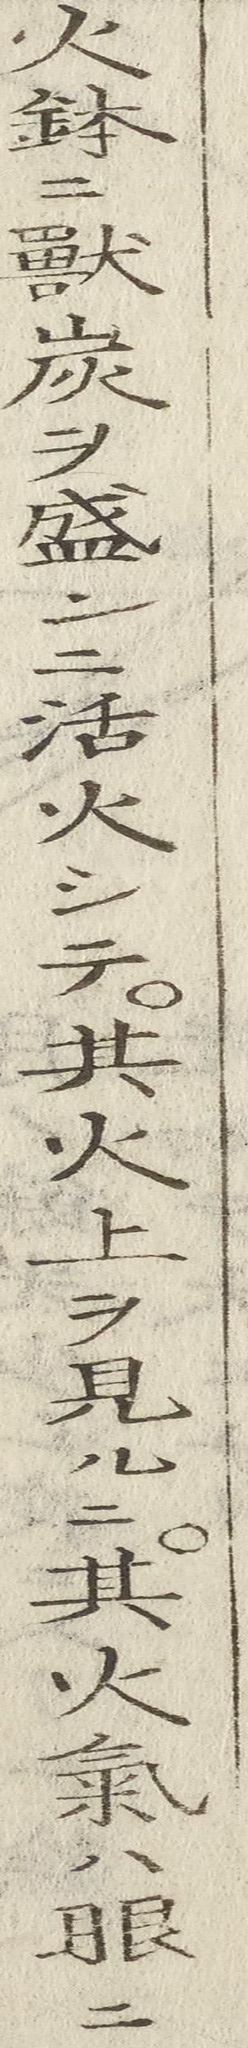火鉢ニ獸炭ヲ盛シニ活火シテ。其火上ヲ見ルニ。其火気ハ眼ニ
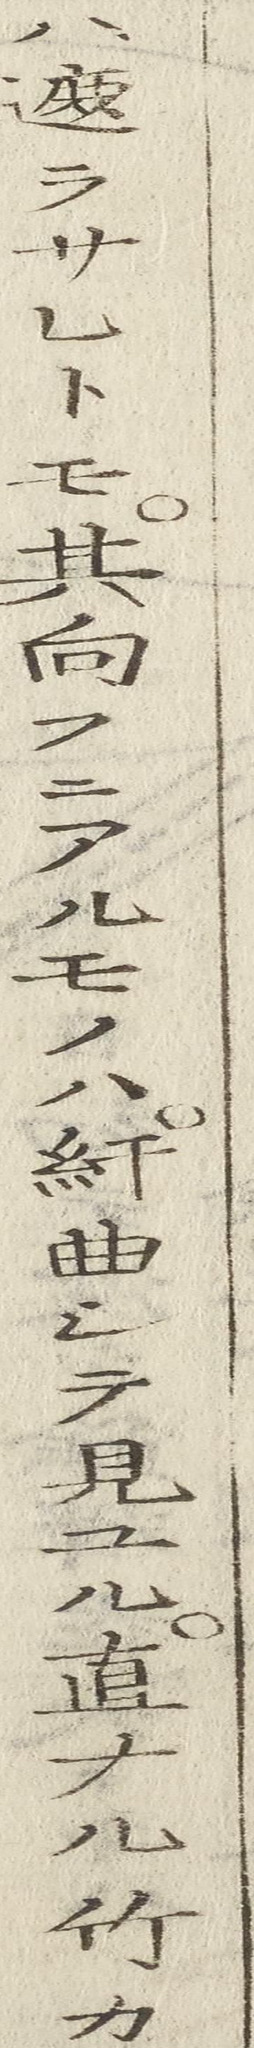ハ遮ラサレトモ。其向フニアルモノハ。紆曲シテ見ユル。直ナル竹カ
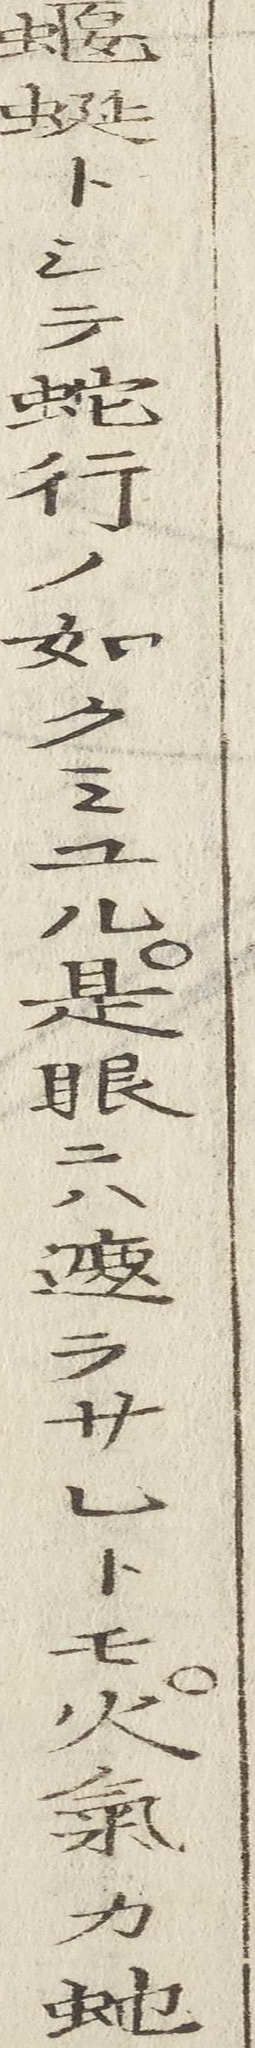蝘蜒トシテ蛇行ノ如クミユル。是眼ニハ遮ラサレトモ。火気カ蛇
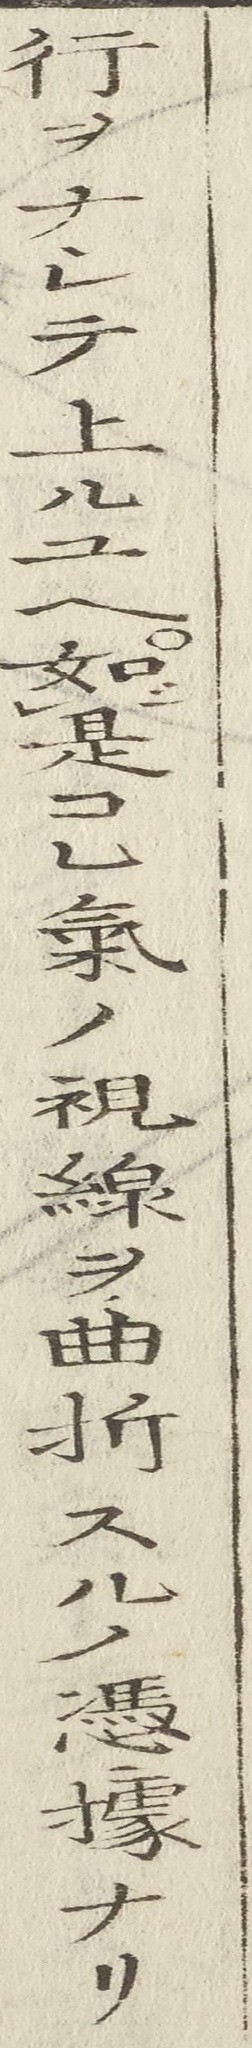行ヲナシテ上ルユヘ。如是コレ気ノ視線ヲ曲折スルノ憑拠ナリ
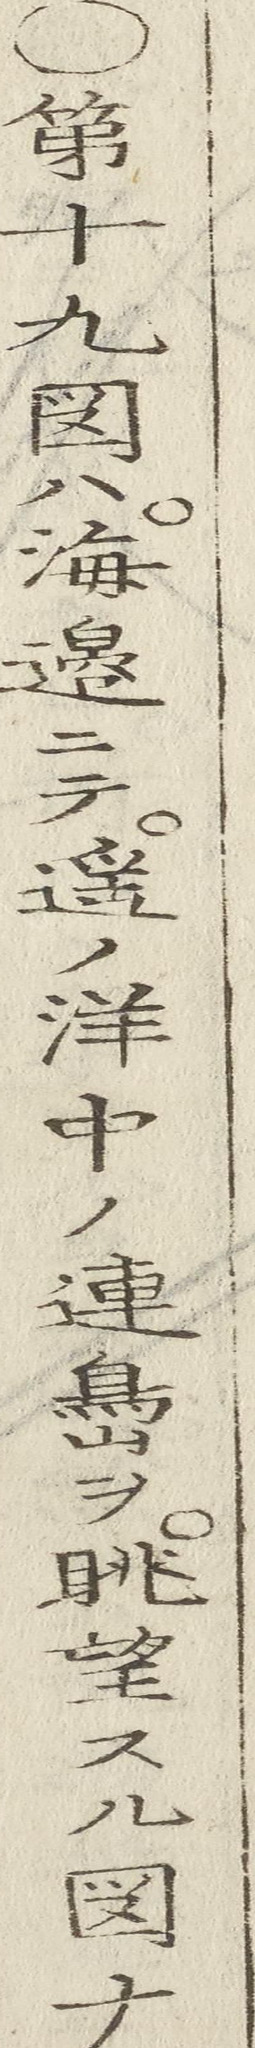○第十九図ハ。海辺ニテ。遙ノ洋中ノ連嶋ヲ。眺望スル図ナ
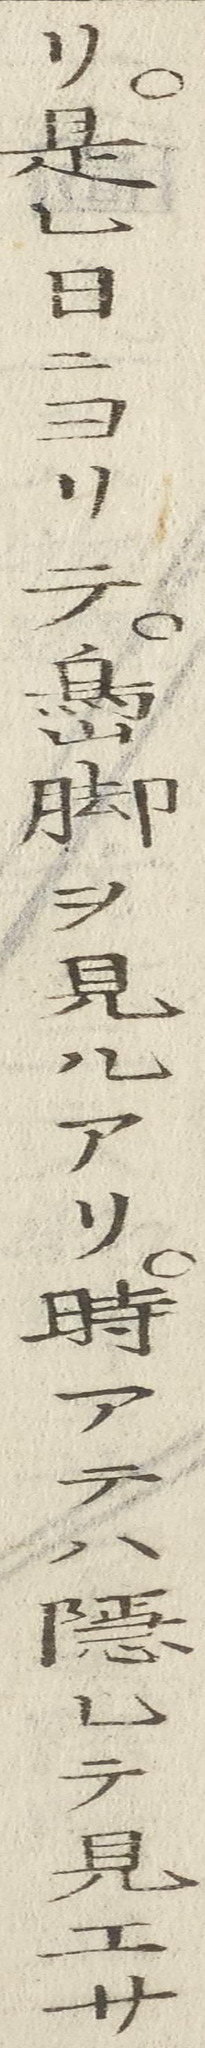リ。是レ日ニヨリテ。嶋脚ヲ見ルアリ。時アテハ隠レテ見エサ
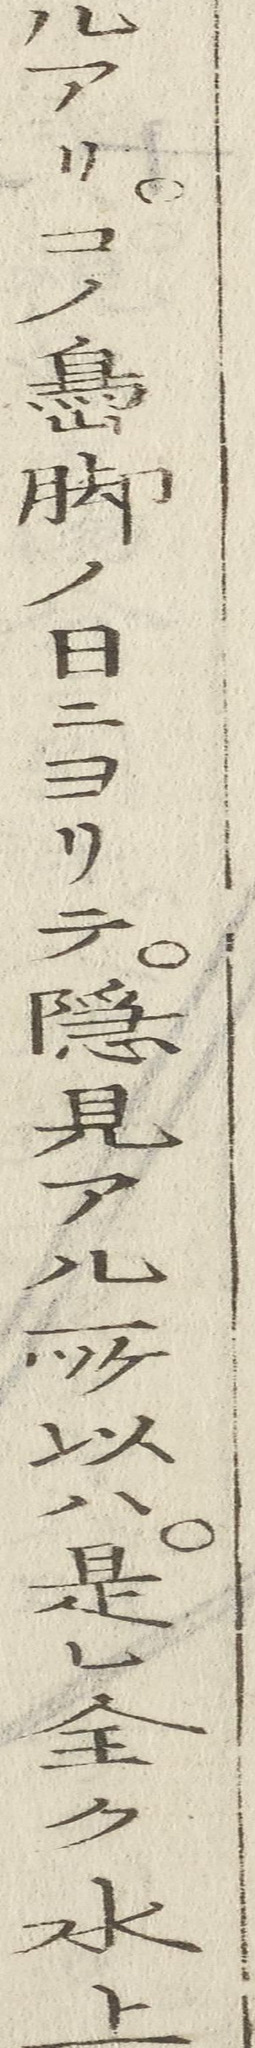ルアリ。コノ嶋脚ノ日ニヨリテ。隠見アル所以ハ。是レ全ク水上
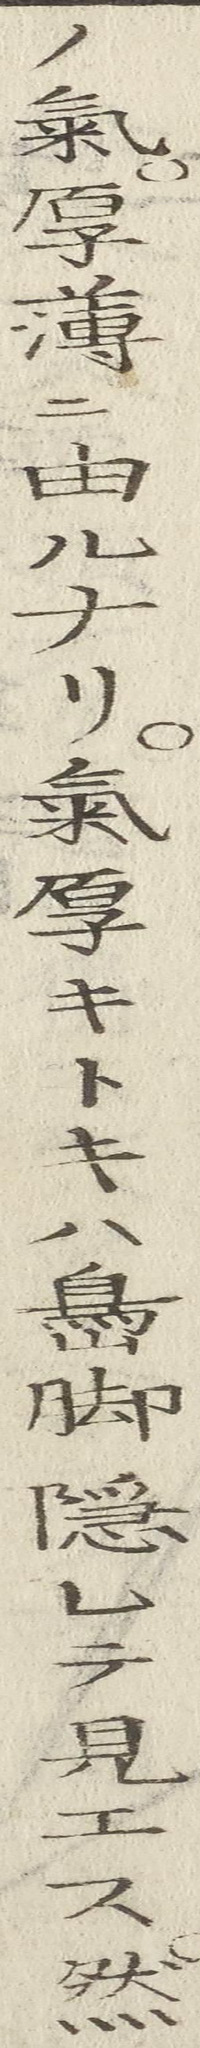ノ気。厚薄ニ由ルナリ。気厚キトキハ嶋脚隠レテ見エス。然

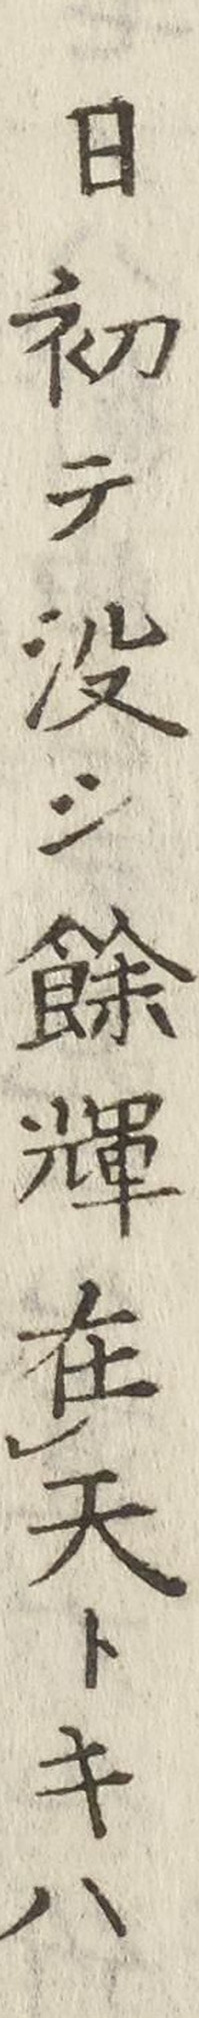日初テ没シ余輝在天トキハ
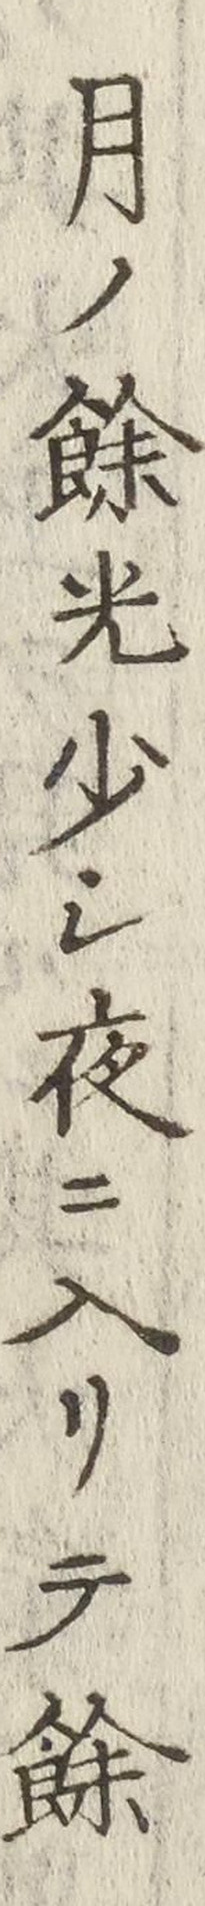月ノ余光少シ夜ニ入リテ余
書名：護法新論　上
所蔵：東京大学地震研究所図書室 Earthquake Research Institute Library, The University of Tokyo, JAPAN
